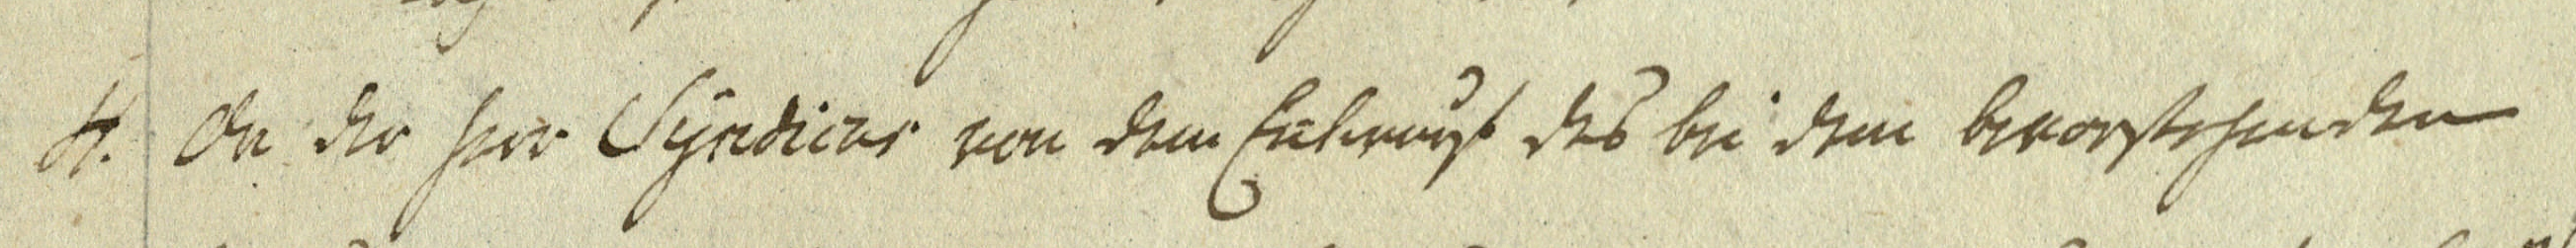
4. Da der Herr Sÿndicus von dem Entwurf des bei dem bevorstehenden
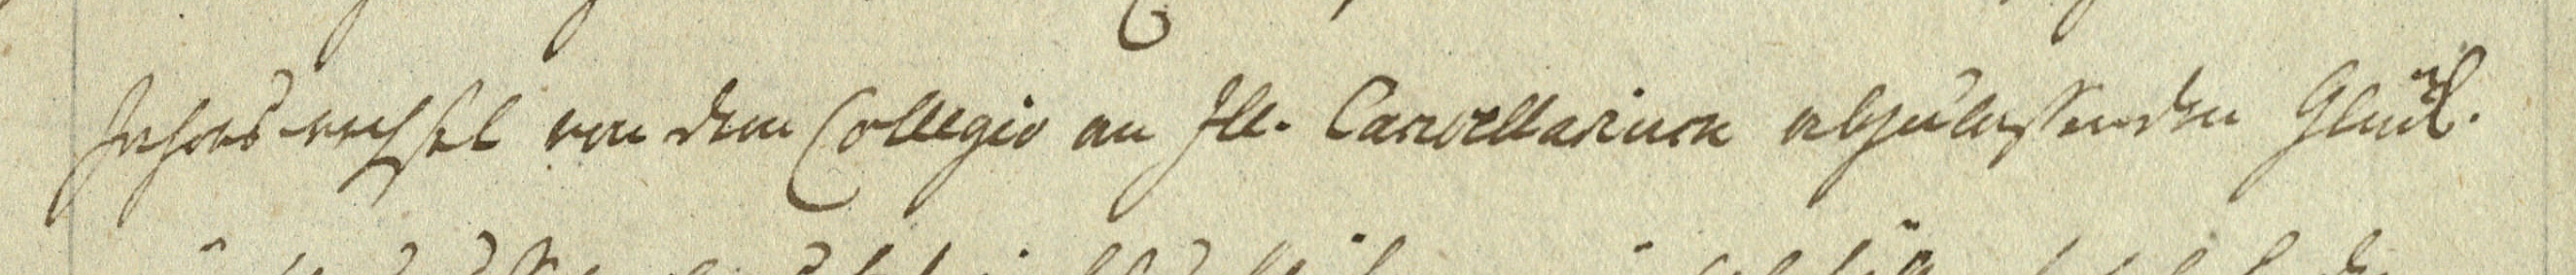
Jahreswechsel von dem Collegio an Ill. Cancellarium abzulassenden Glück¬
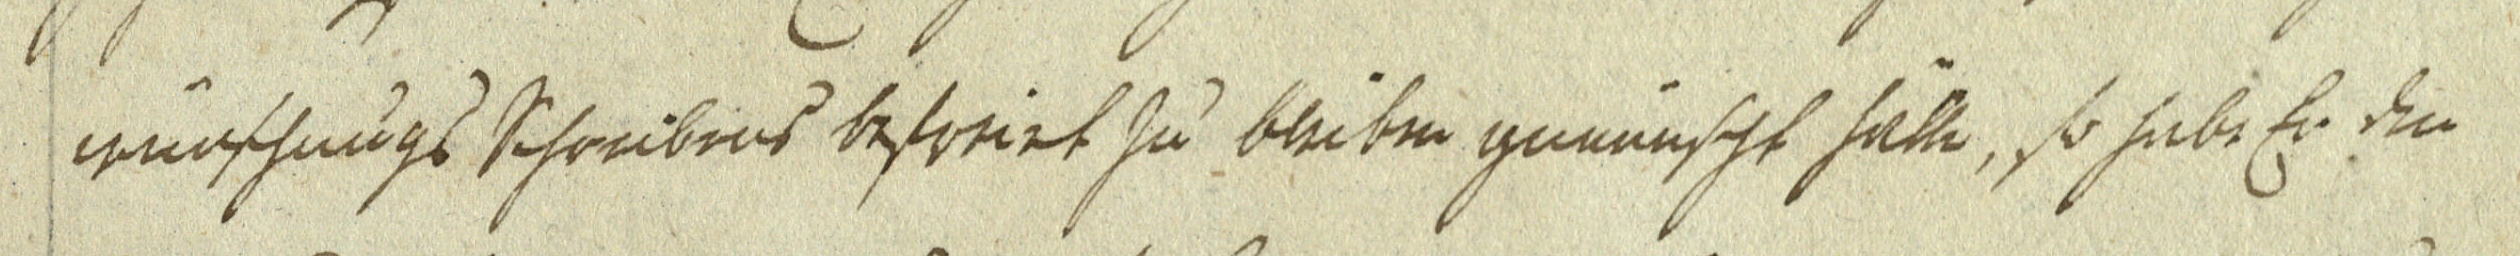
wünschungs Schreibens befreiet zu bleiben gewünscht hätte, so habe Er den
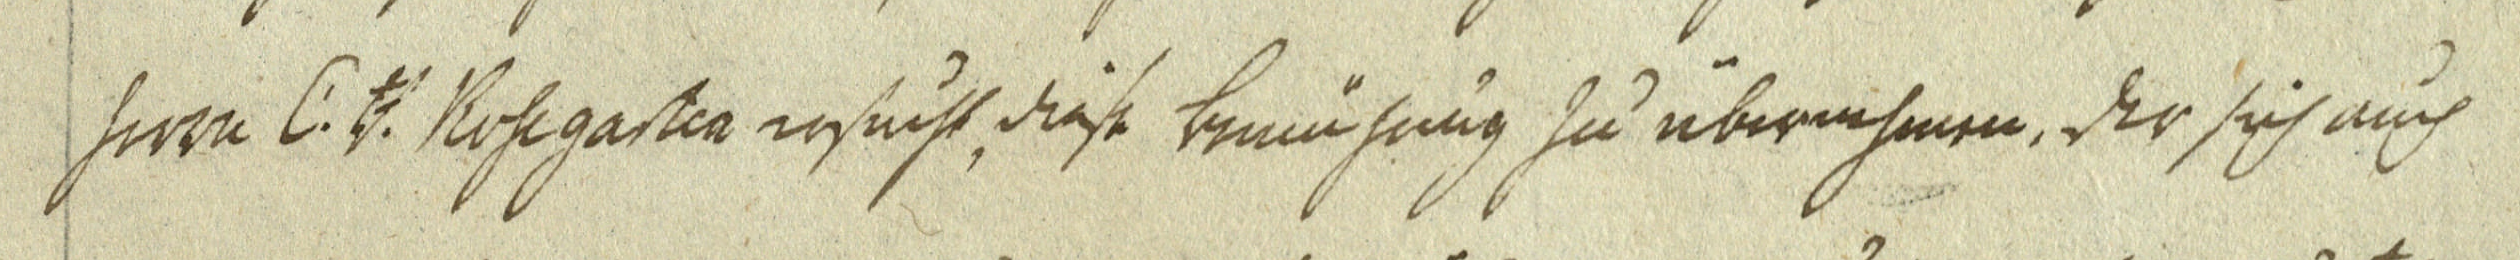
Herrn C. R. Kosegarten ersucht, diese Bemühung zu übernehmen, der sich auch
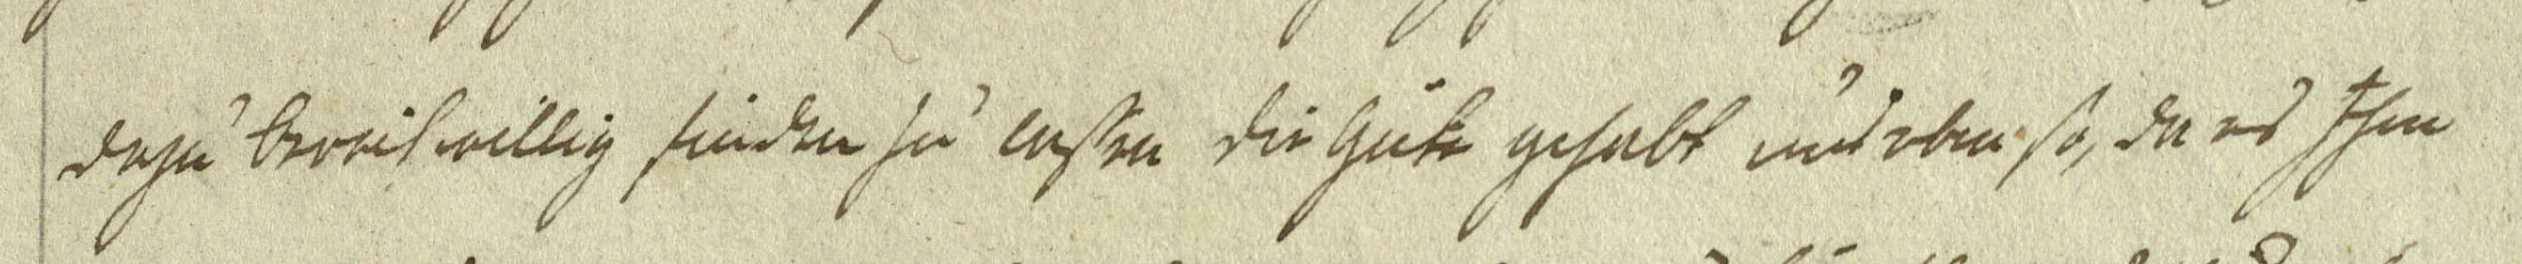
dazu bereitwillig finden zu lassen die Güte gehabt und eben so, da es Ihm
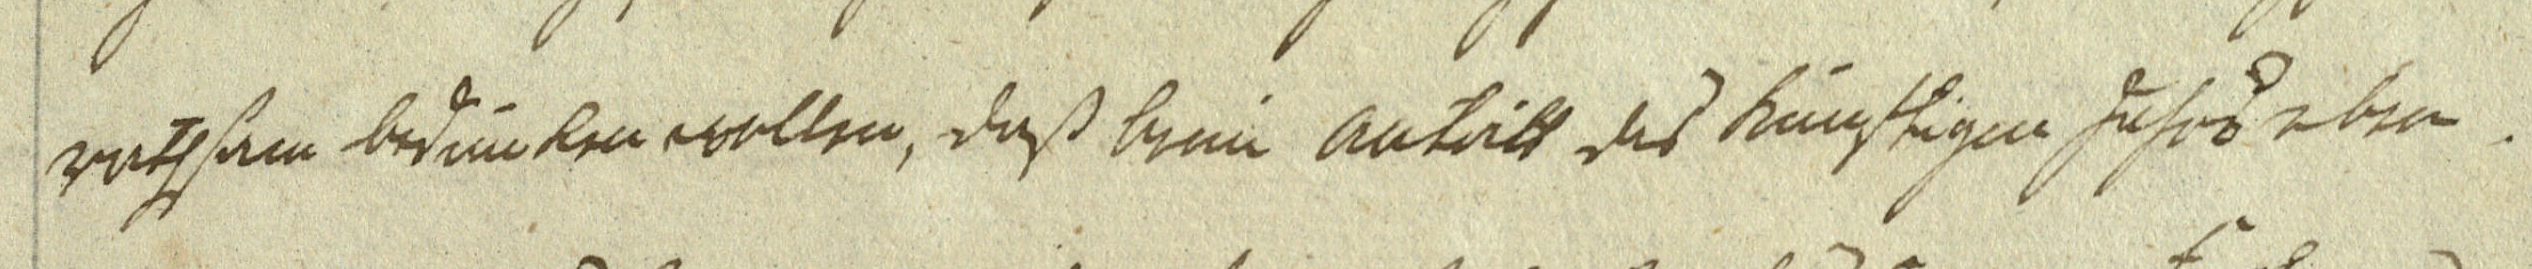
rathsam bedünken wollen, daß beim Antritt des künftigen Jahrs eben¬
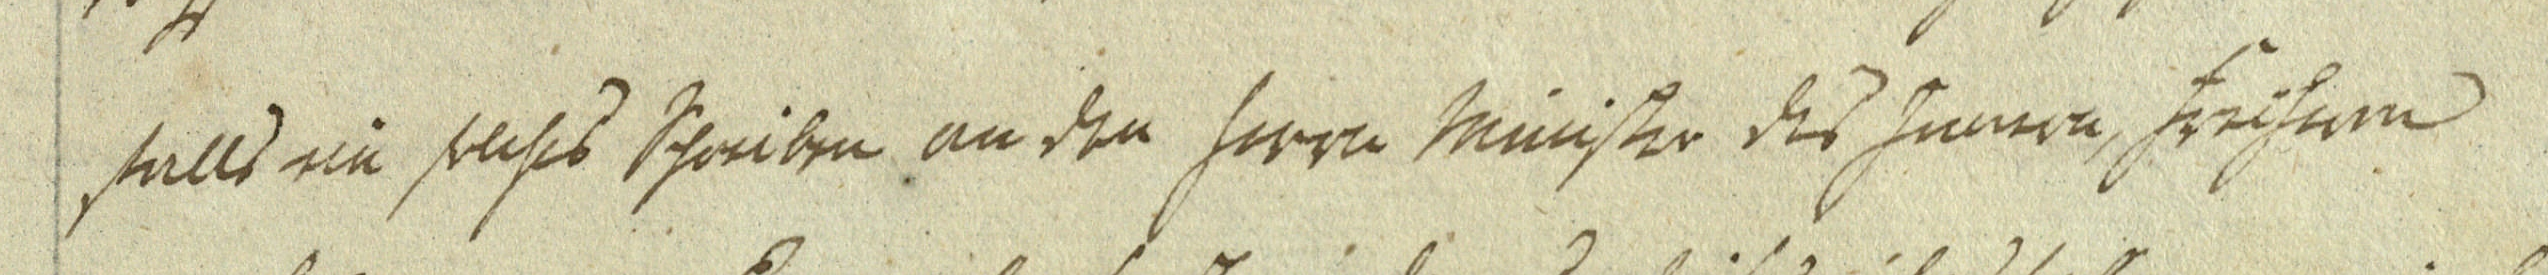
falls ein solches Schreiben an den Herrn Minister des Innern Freiherrn
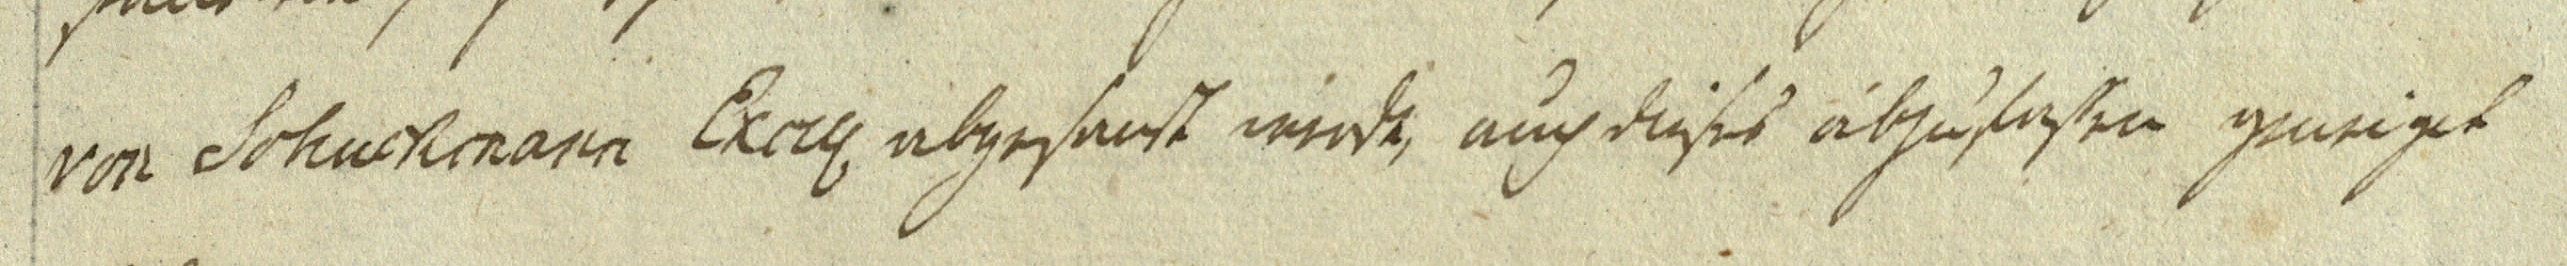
von Schuckmann Excell abgesandt werde, auch dieses abzufassen geneiget
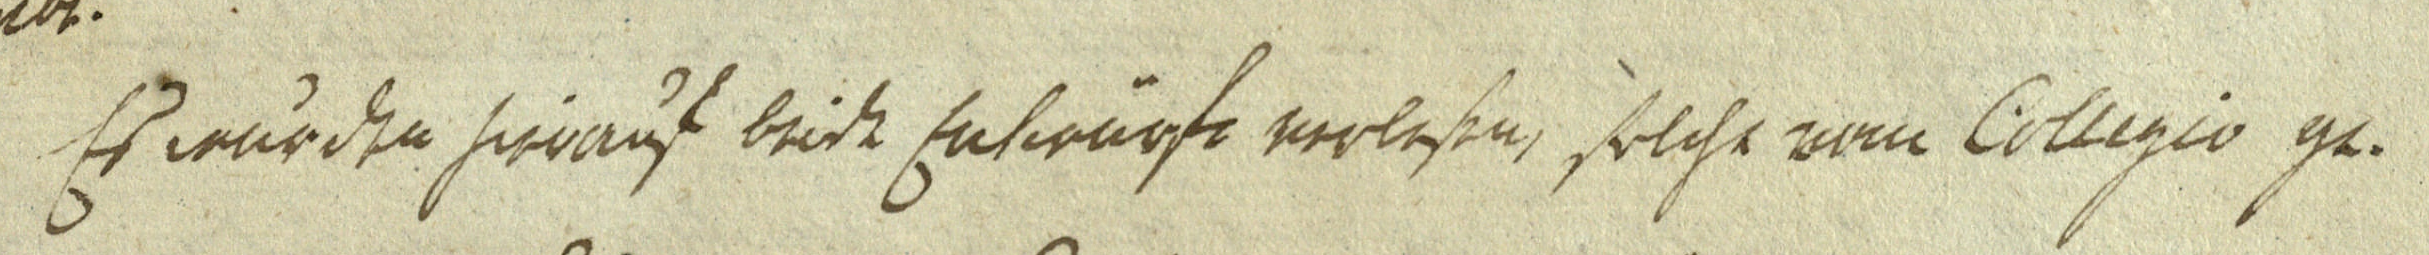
Es wurden hierauf beide Entwürfe verlesen, solche vom Collegio ge¬
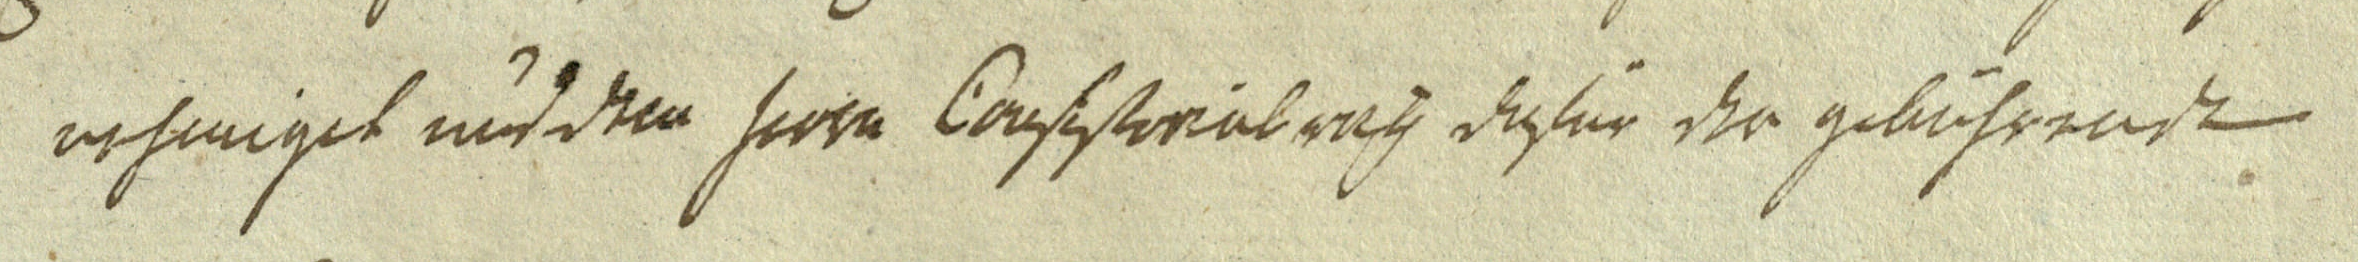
nehmiget und dem Herrn Consistorialrath dafür der gebührende
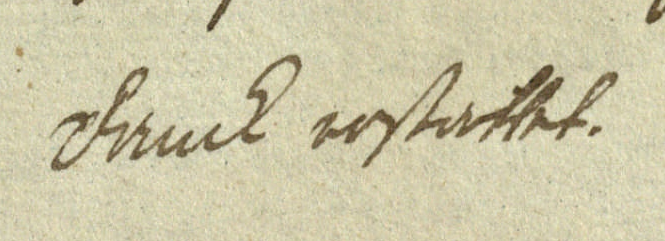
Danck erstattet.
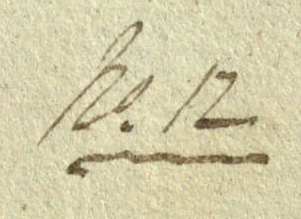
Nº 12
